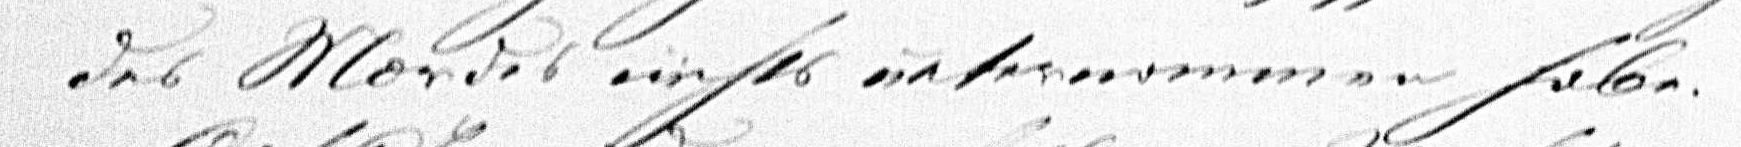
des Mordes nichts unternommen habe.
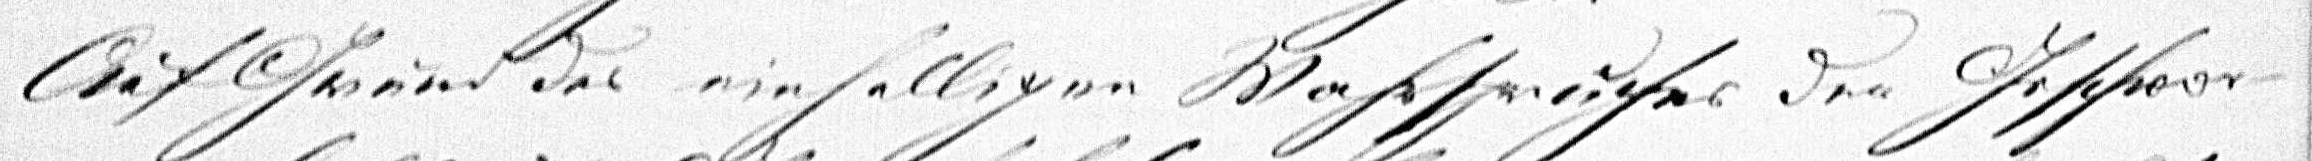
Auf Grund des einhelligen Wahrspruches der Geschwor¬
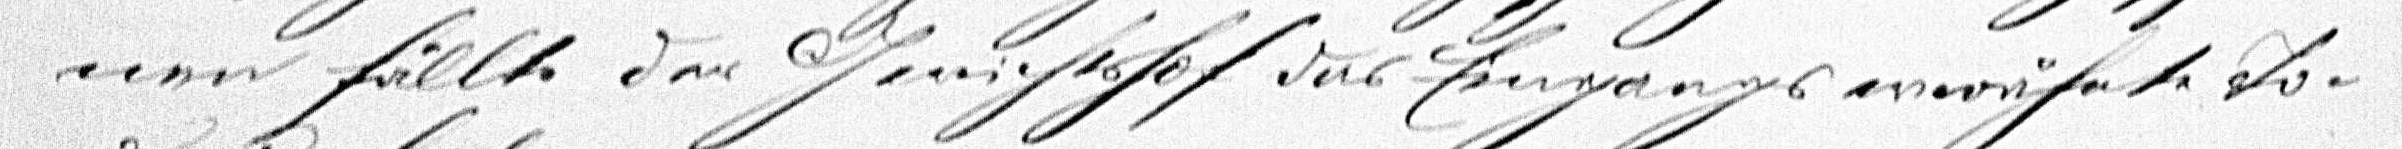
enen hällte der Gerichtshof das Eingangserwähnte To¬
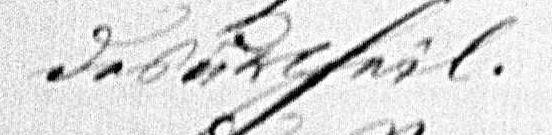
desurtheil.
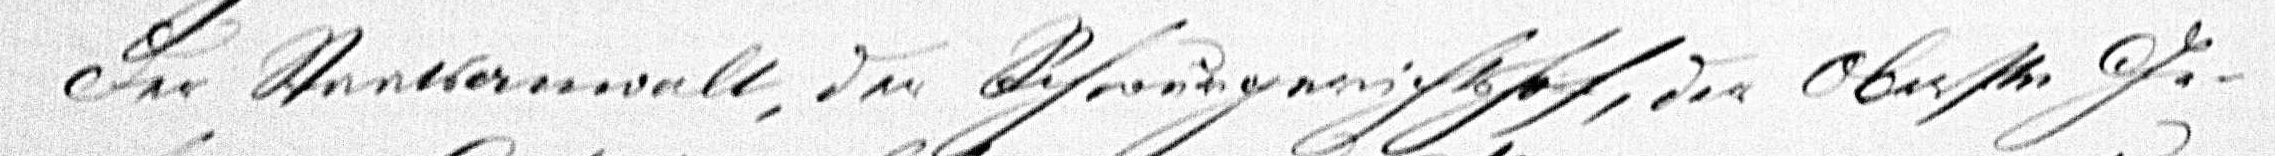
Der Staatsanwalt, der Schwurgerichtshof, der Oberste Ge¬
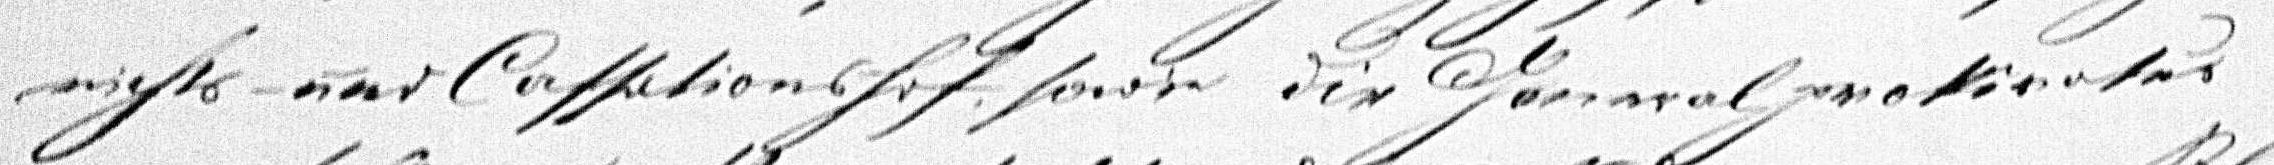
richts- und Cassationshof sowie die Generalprokuratur
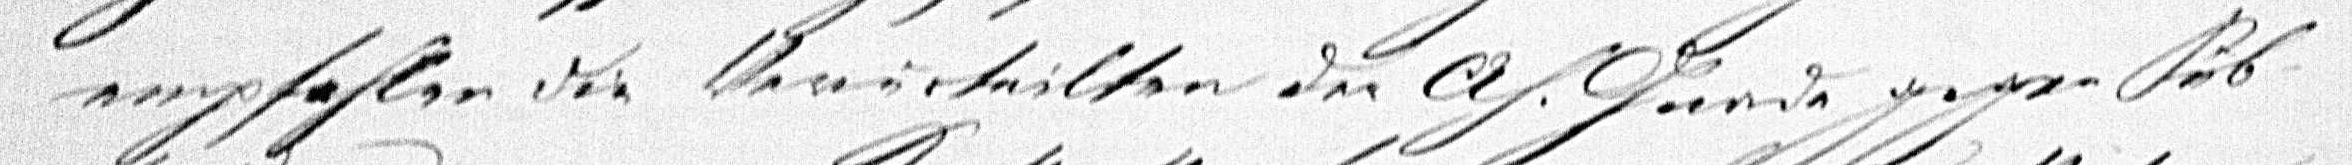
empfehlen die Verurtheilten der Ah. Gnade gegen Sub¬
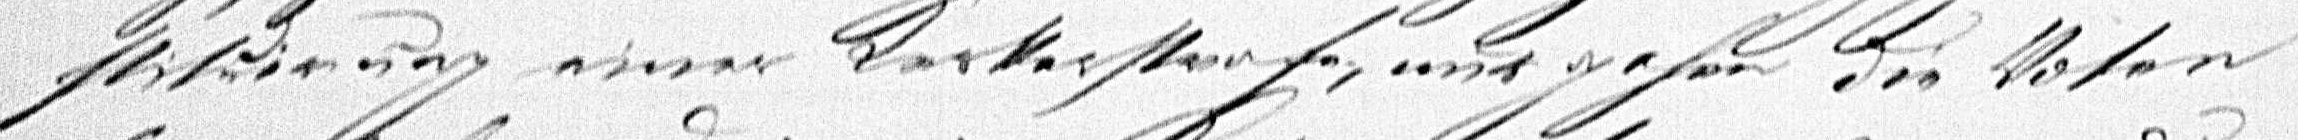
stituirung einer Kerkerstrafe, und gehen die Voten
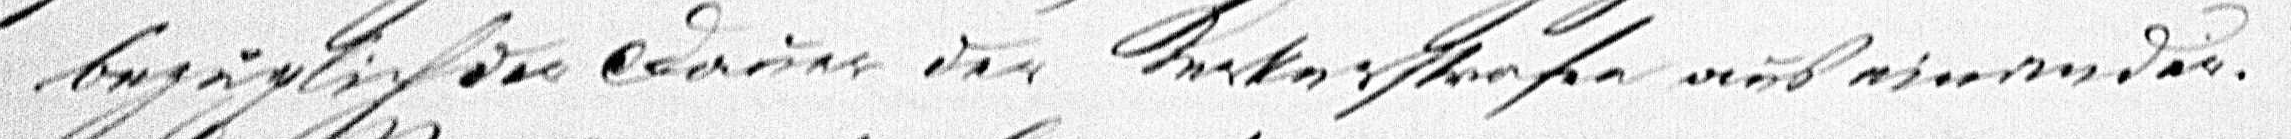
bezüglich der Dauer der Kerkerstrafe auseinander.
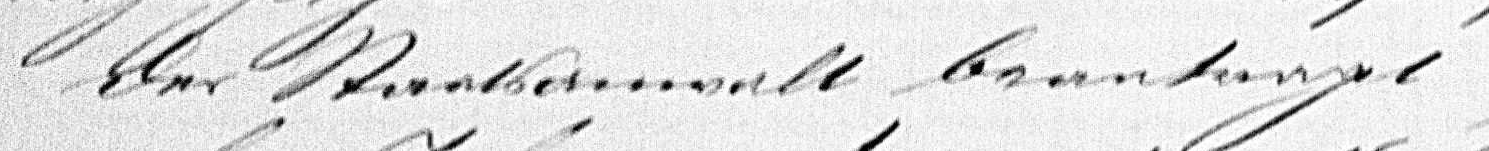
Der Staatsanwalt beantragt
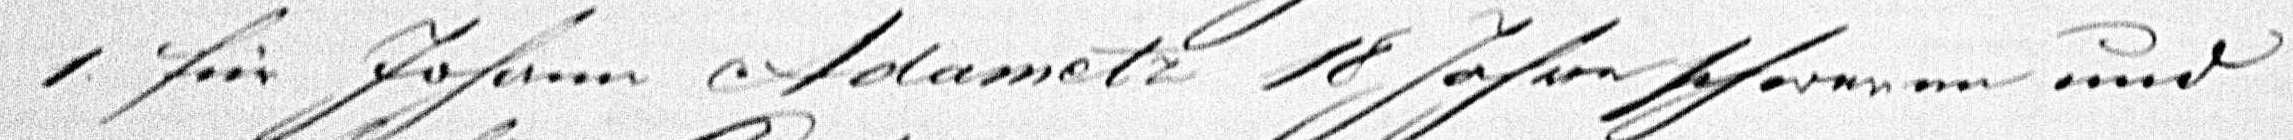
1. für Johann Adametz 18 Jahre schweren und
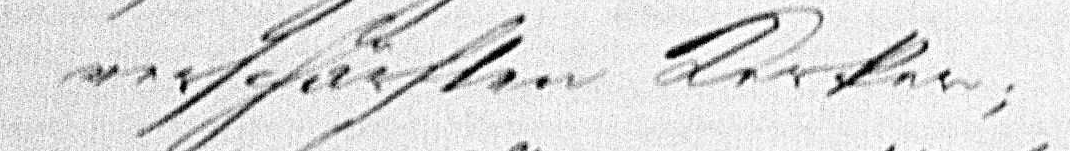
verschärften Kerker;
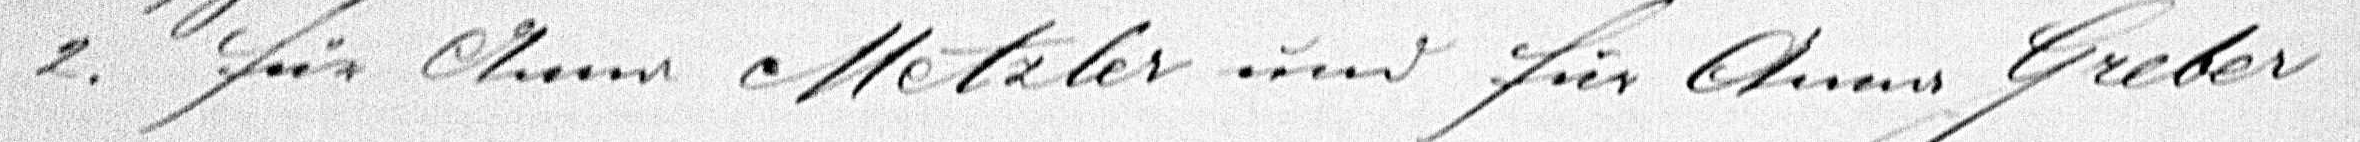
2. für Anna Metzler und für Anna Greber
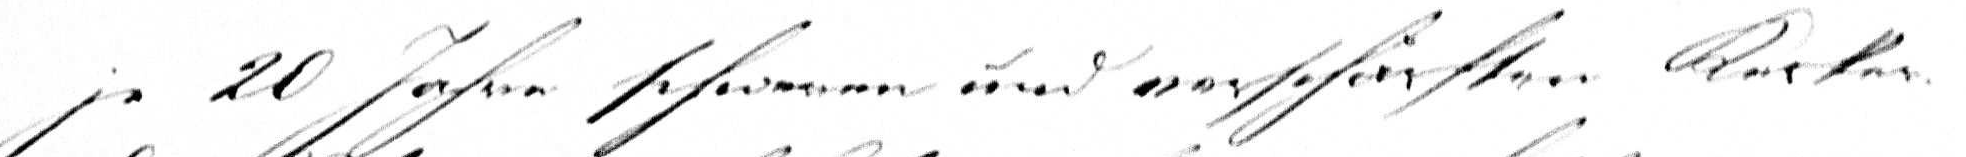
je 20 Jahre schweren und verschärften Kerker.
